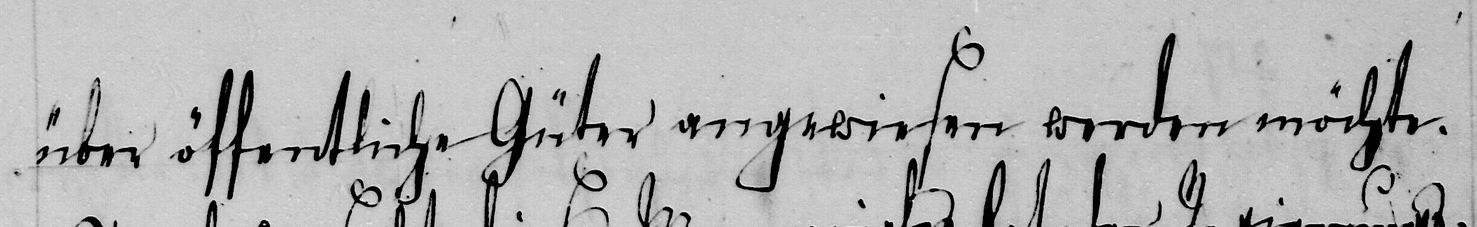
über öffentliche Güter angewiesen werden möchte.
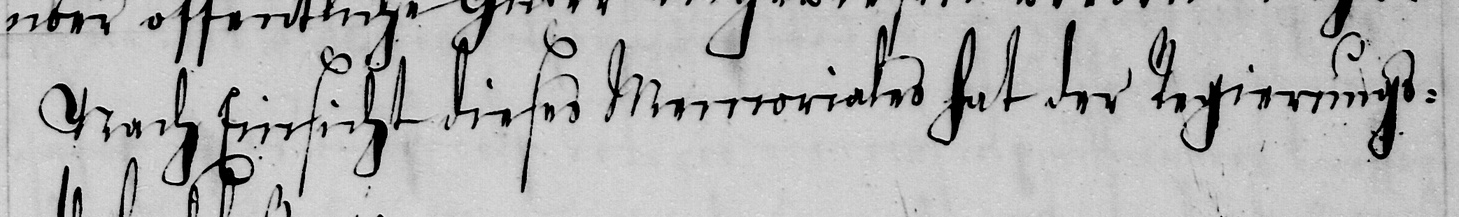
Nach Einsicht dieses Memoriales hat der Regierungs¬
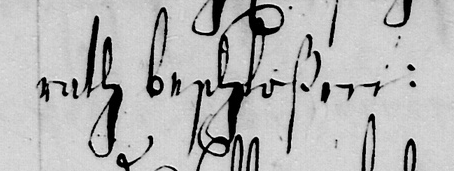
th beschloßen:
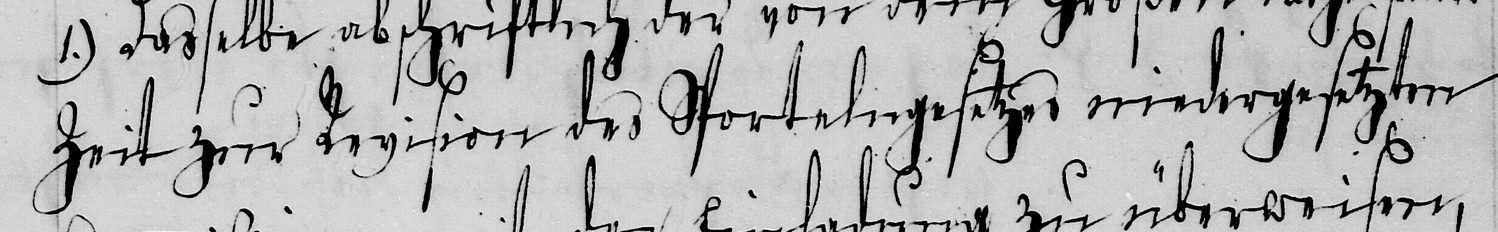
Zeit zur Revision des Sportelngesetzes niedergesetzten
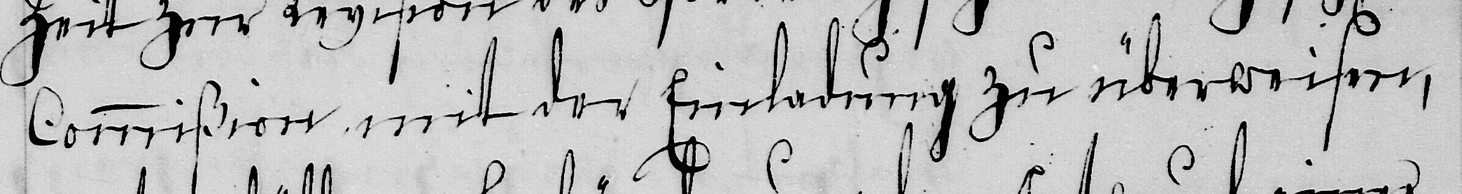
Commißion mit der Einladung zu überweisen,
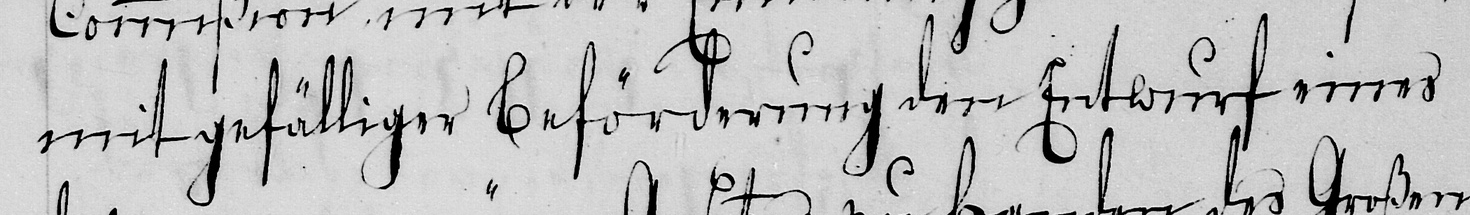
mit gefälliger Beförderung den Entwurf eines
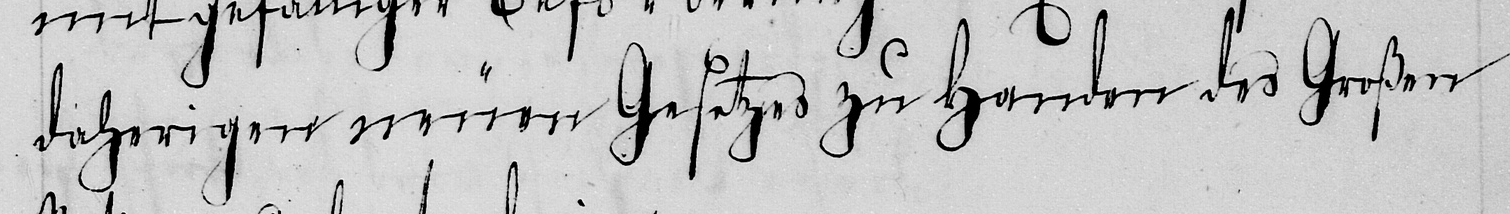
daherigen neuen Gesetzes zu Handen des Großen
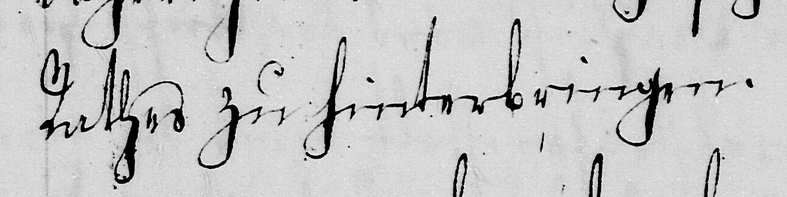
Rathes zu hinterbringen.
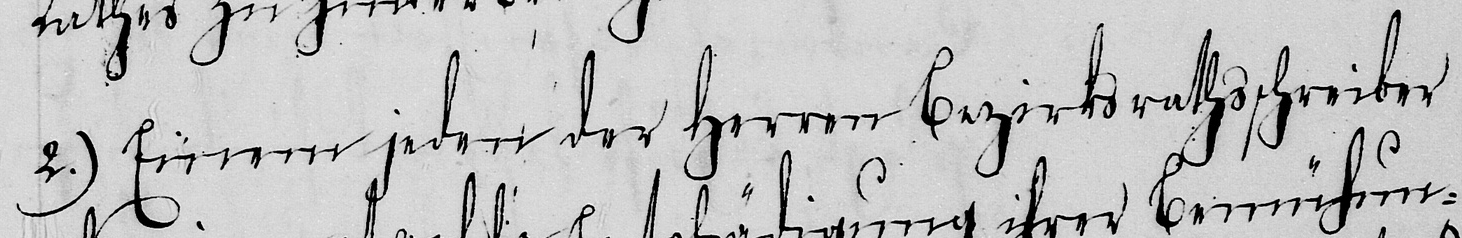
2.) Einem jeden der Herren Bezirksrathsschreiber
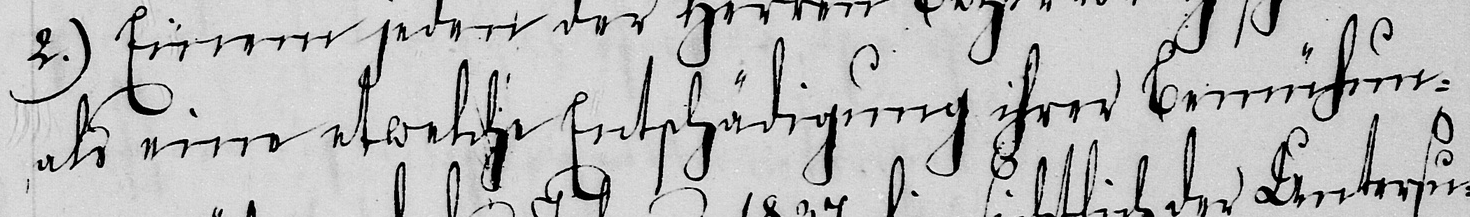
als eine etwelche Entschädigung ihrer Bemühun¬
